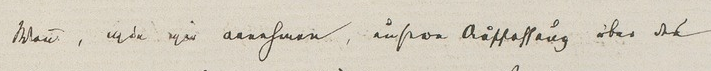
Wenn, wie wir annehmen, unsere Auffassung über das
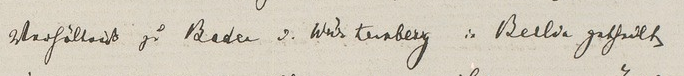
Verhältniß zu Baden u. Würtemberg in Berlin getheilt
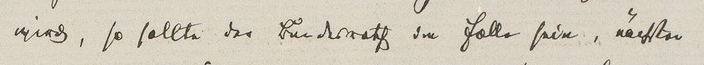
wird, so sollte der Bundesrath im Falle sein, nächsten
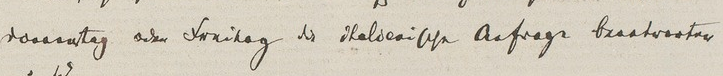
Donnerstag oder Freitag die italienische Anfrage beantworten
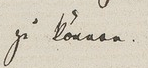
zu können.
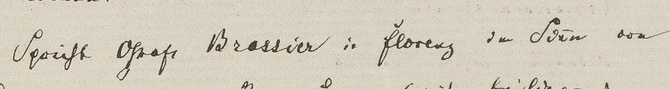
Spricht Graf Brassier in Florenz im Sinne von
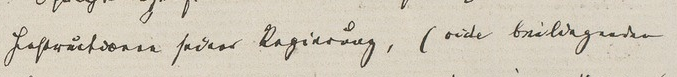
Instructionen seiner Regierung, (vide beiliegenden
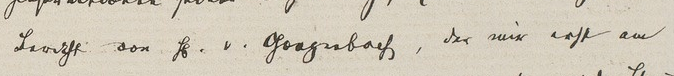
Bericht von H. v. Gonzenbach, der mir erst am
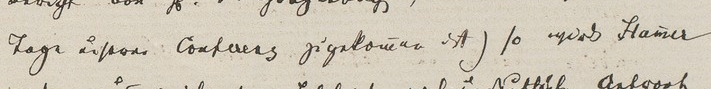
Tage unserer Conferenz zugekommen ist) so wird Hammer
